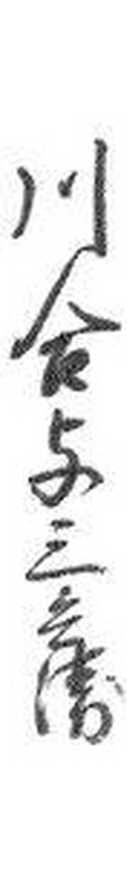川合与三兵衛
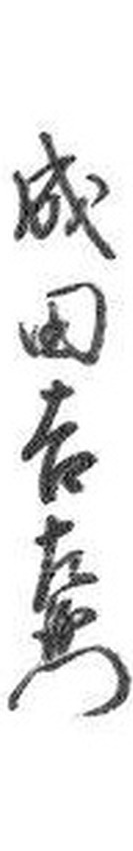成田吉左衛門
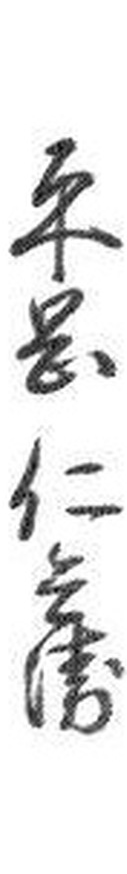平岡仁兵衛
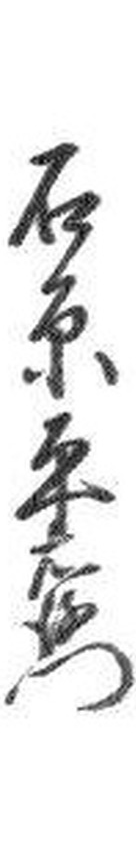石原平右衛門
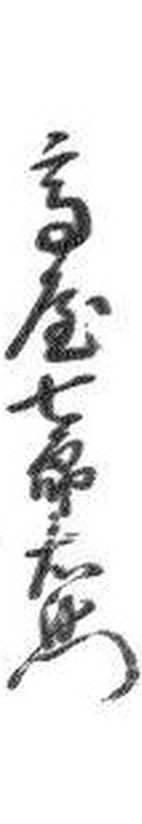高屋七郎右衛門
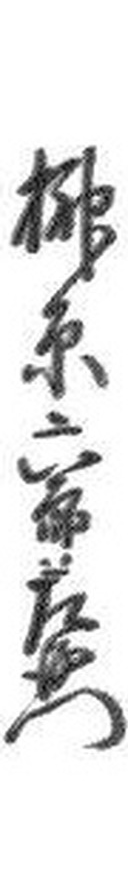榊原六郎左衛門
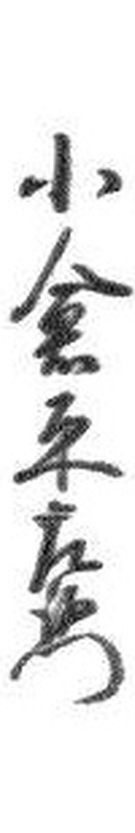小倉平左衛門
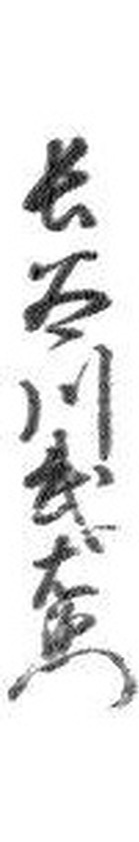長谷川武右衛門
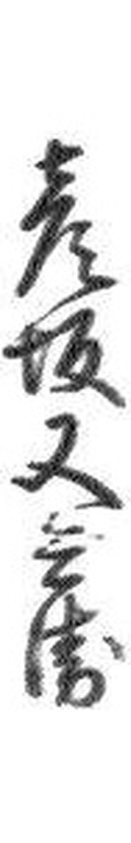彦坂又兵衛
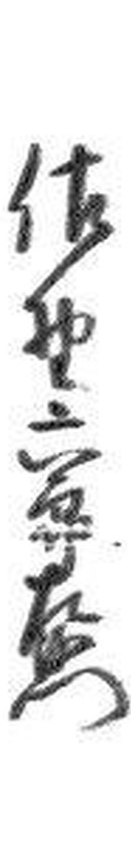佐野六郎左衛門

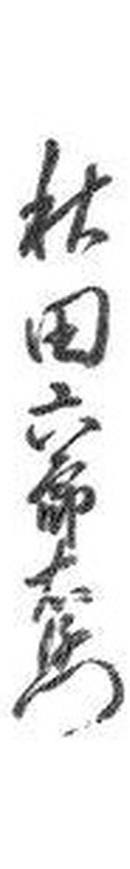秋田六郎右衛門
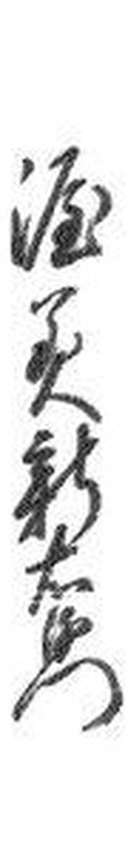渥美新右衛門
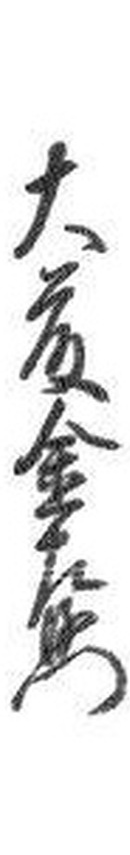大藤金左衛門
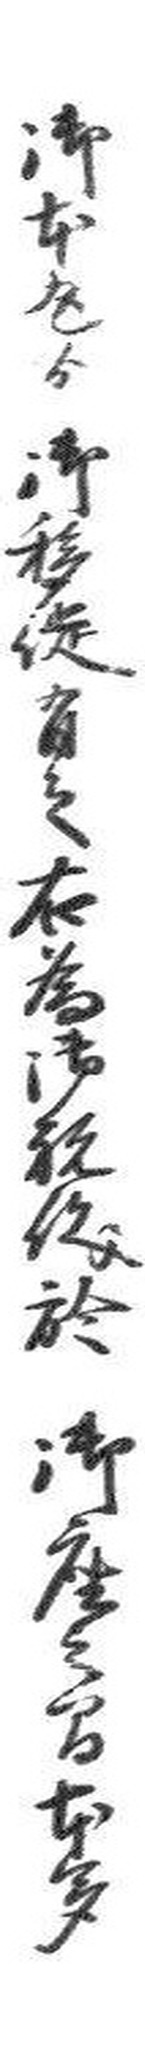御本丸ゟ御移徙有之右為御祝儀於御座之間本多
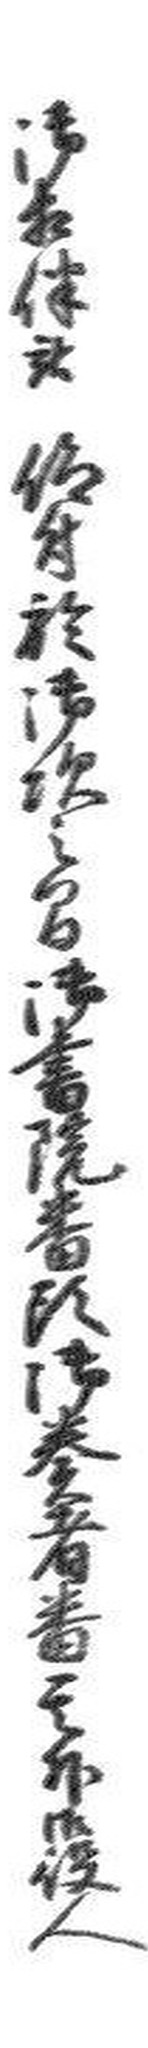御相伴被仰付於御次之間御書院番頭御奏者番其外御役人
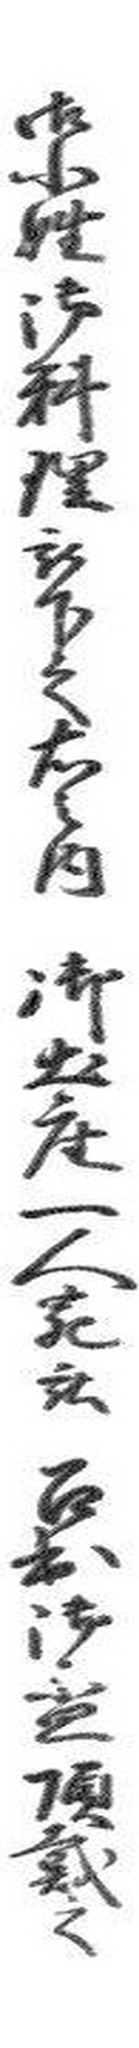御小姓御料理被下之右之内御出座宛被召出御盃頂戴之
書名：家譜 十一 昌親公 従延宝二年到延宝四年八月
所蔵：福井県文書館 Fukui Prefectural Archives
